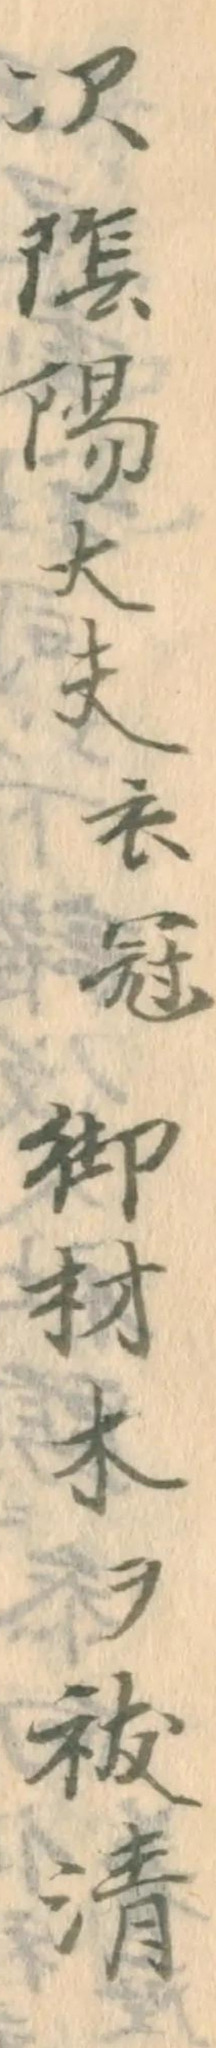次陰陽大夫衣冠御材木ヲ祓清
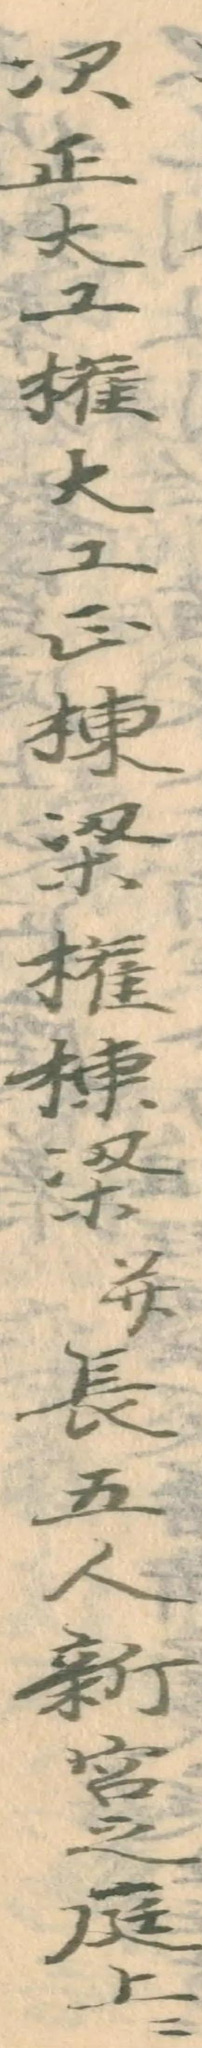次正大工権大工正棟梁権棟梁并長五人新宮之庭上ニ
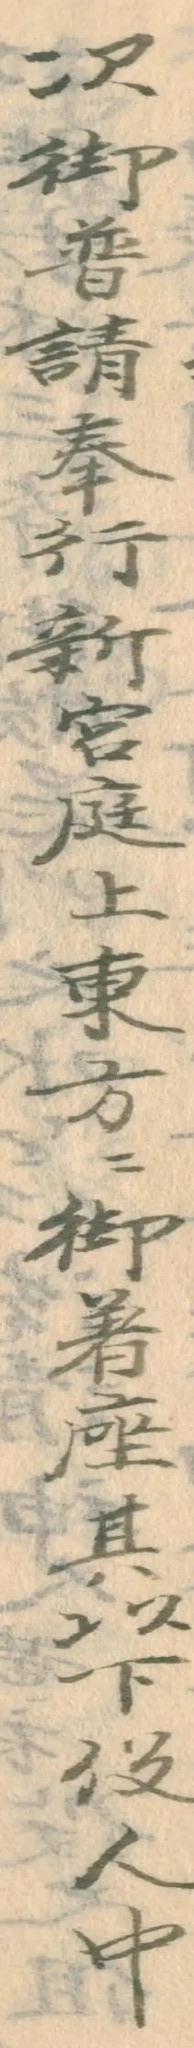次御普請奉行新宮庭上東方ニ御着座其以下役人中
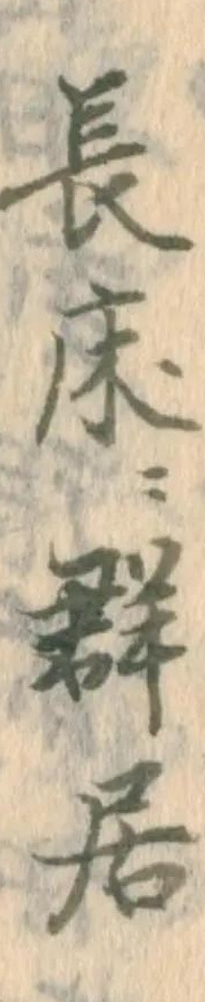長床ニ群居
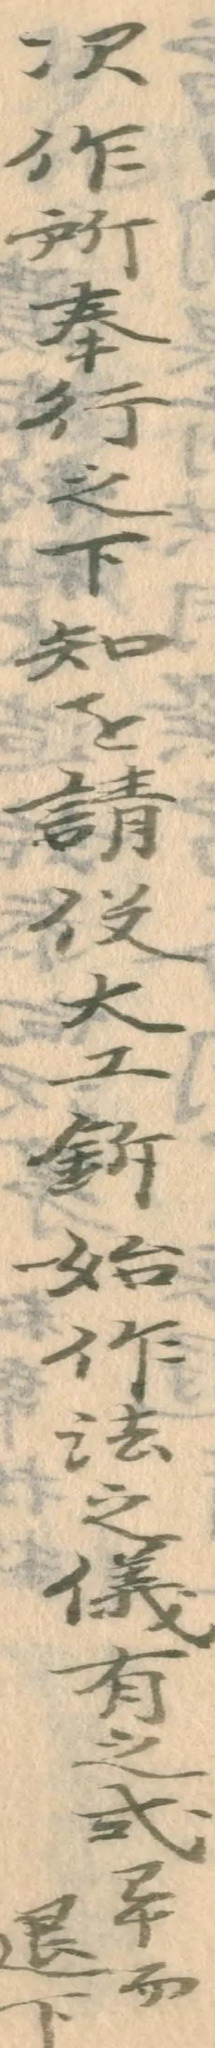次作所奉行之下知を請役大工釿始作法之儀有之式畢而退下
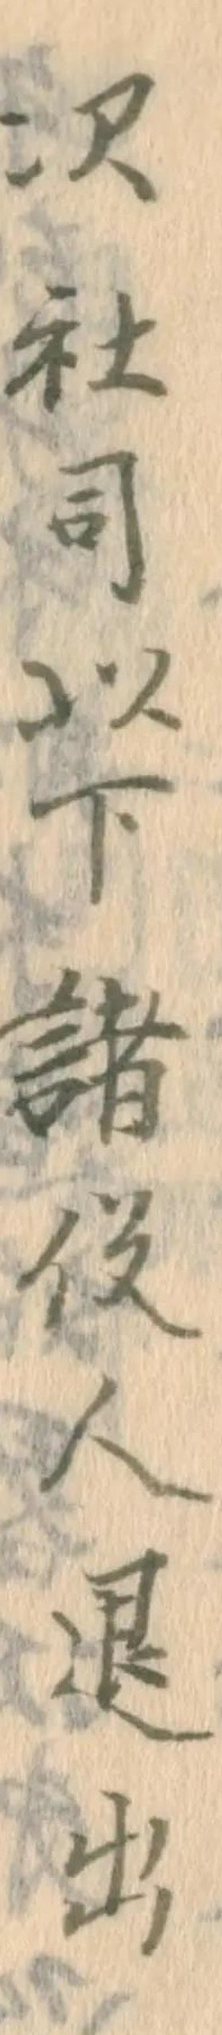次社司以下諸役人退出
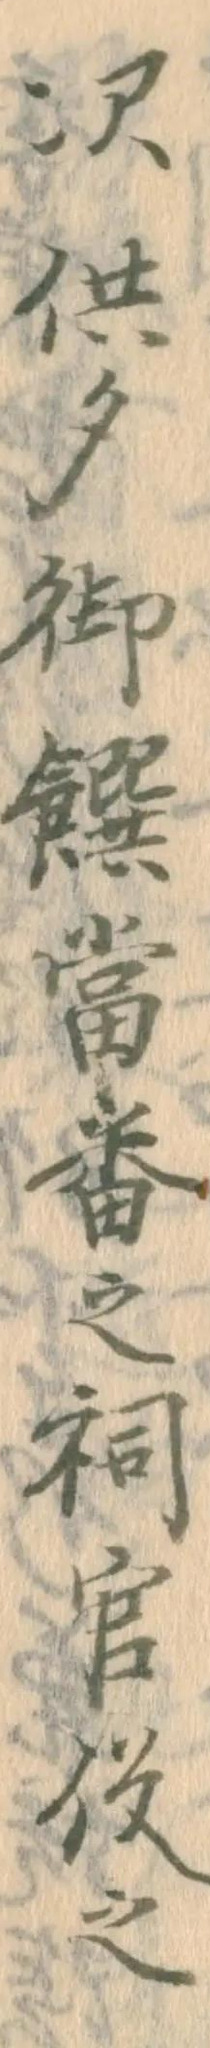次供夕御饌当番之祠官役之
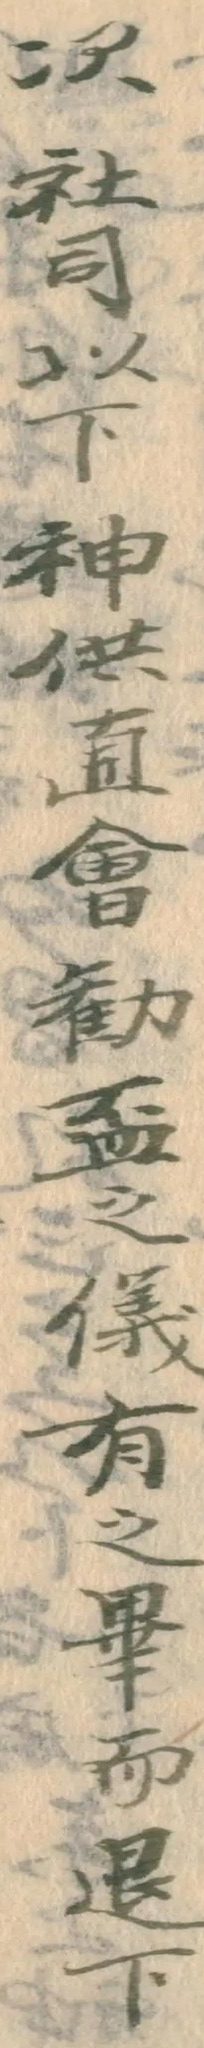次社司以下神供直会勧盃之儀有之畢而退下
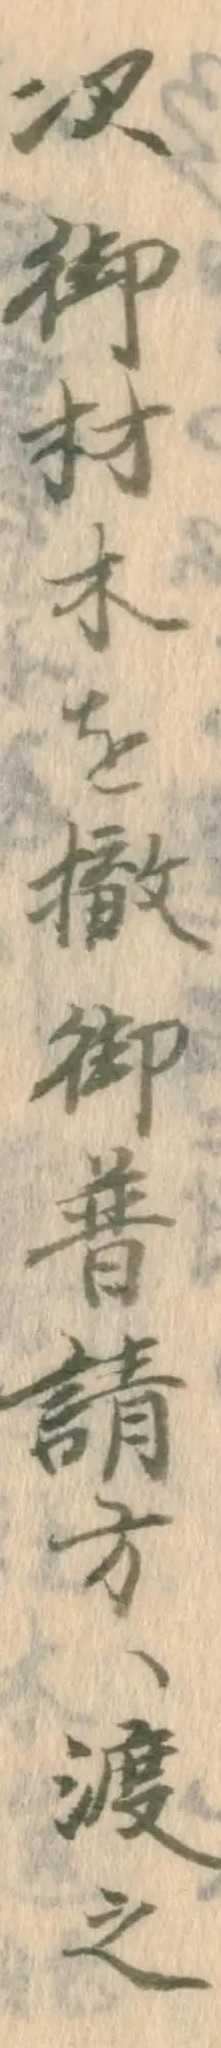次御材木を撤御普請方へ渡之
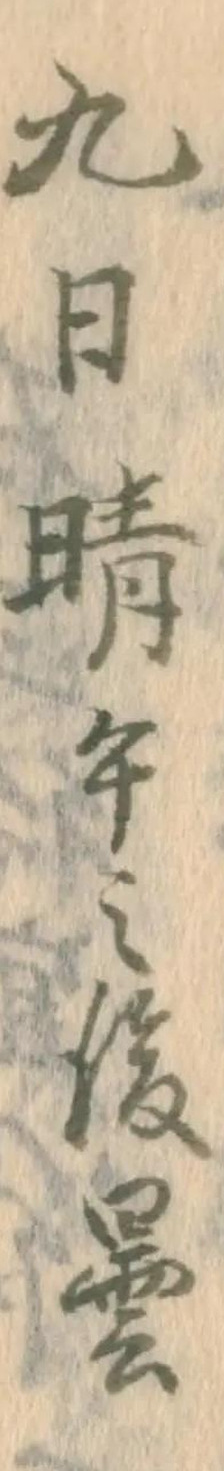九日晴午之後曇
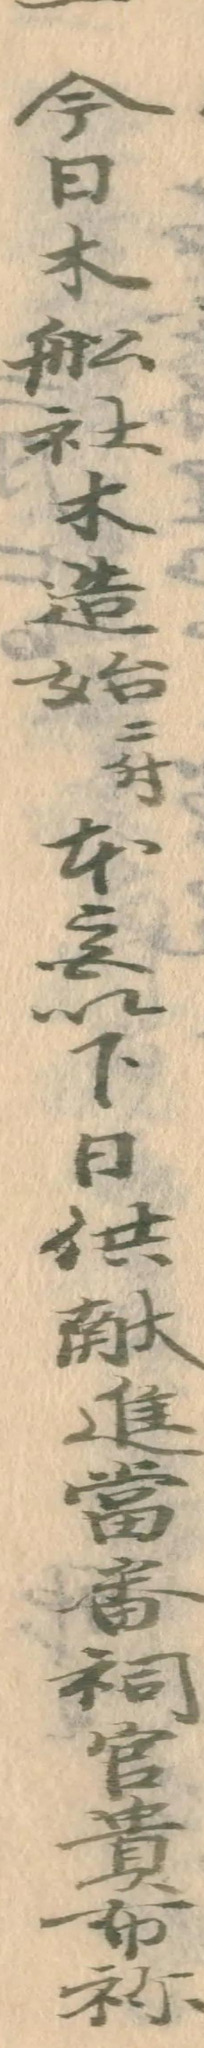一今日木船社木造始ニ付本宮以下日供献進当番祠官貴布祢
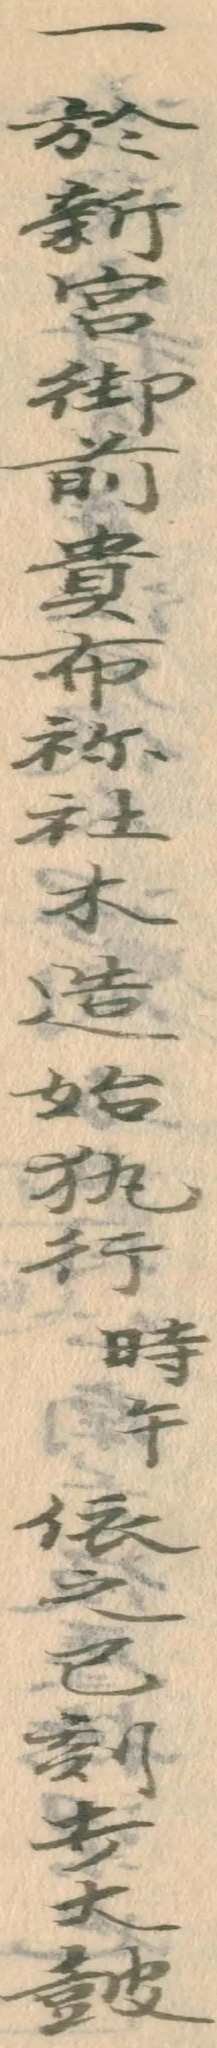一於新宮御前貴布祢社木造始執行時午依之巳刻打大鼓

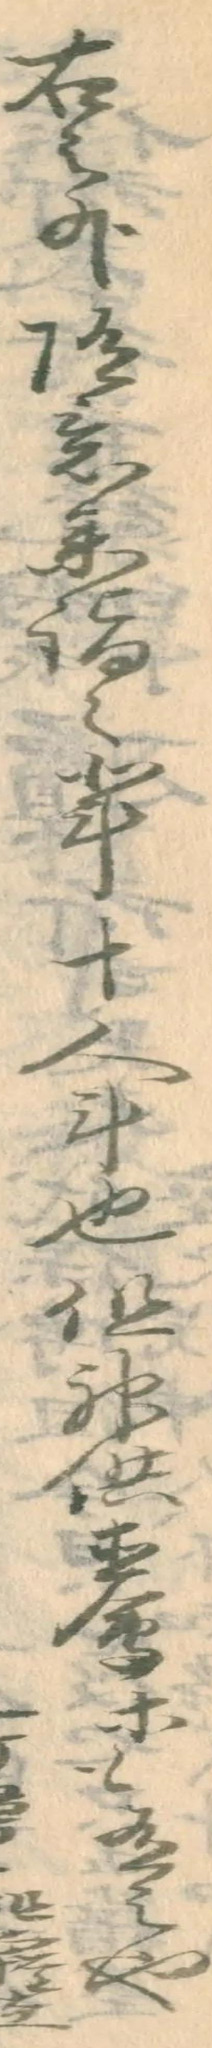右之外随意参詣之輩十人計也但神供直会等も有之也
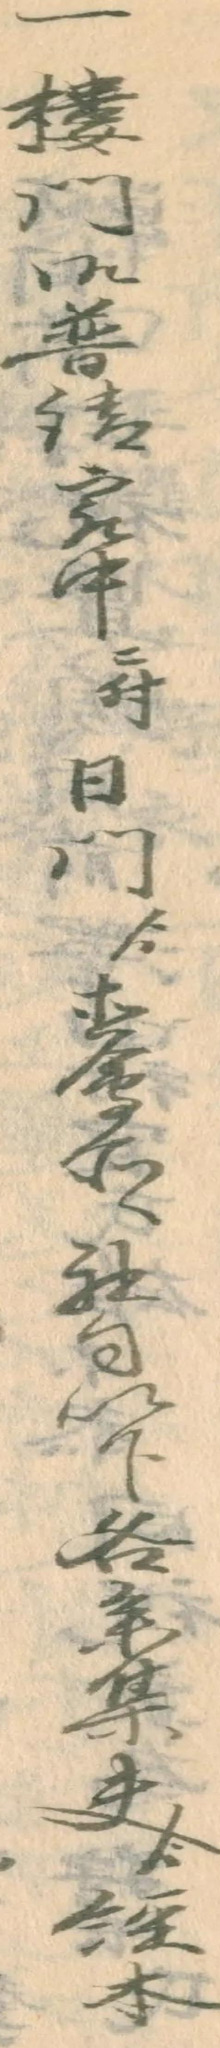一楼門御普請最中ニ付日門ゟ直会所へ社司以下各参集夫ゟ経本
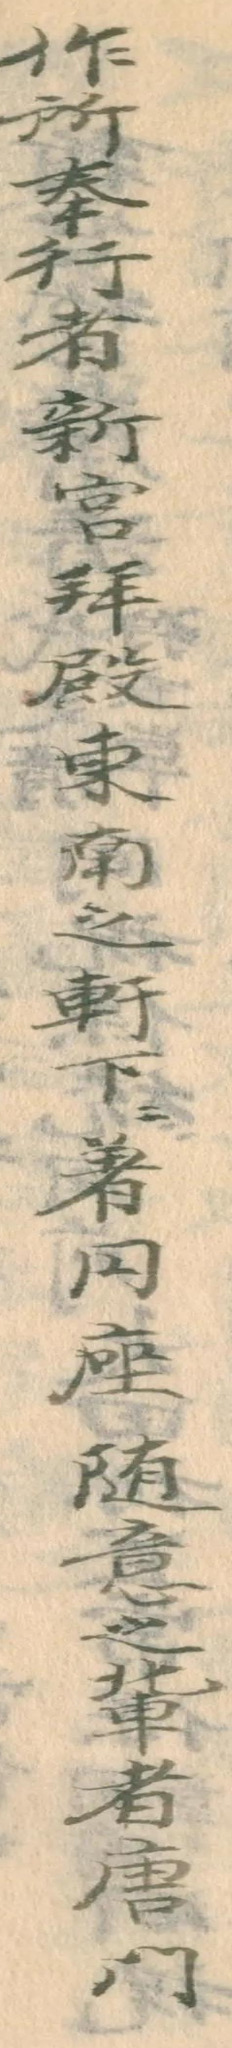作所奉行は新宮拝殿東南之軒下ニ着用座随意之輩者唐門
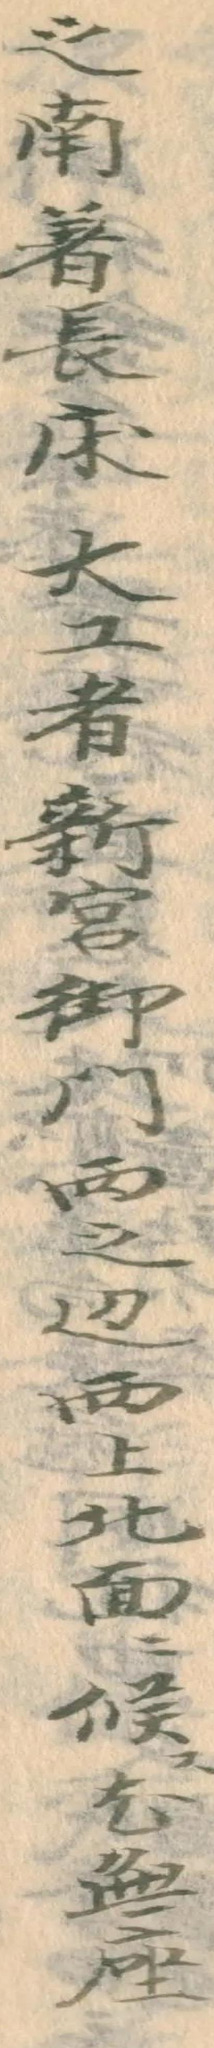之南着長床大工は新宮御門西之辺西上北面ニ候ス尤無座
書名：賀茂社記録. 第17冊
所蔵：国立国会図書館 National Diet Library, JAPAN
